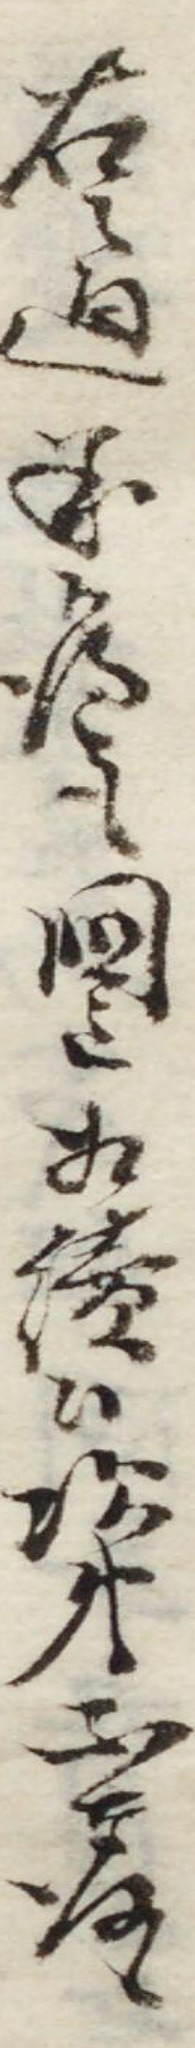右之通承候得とも国迄相続候次第不奉存候
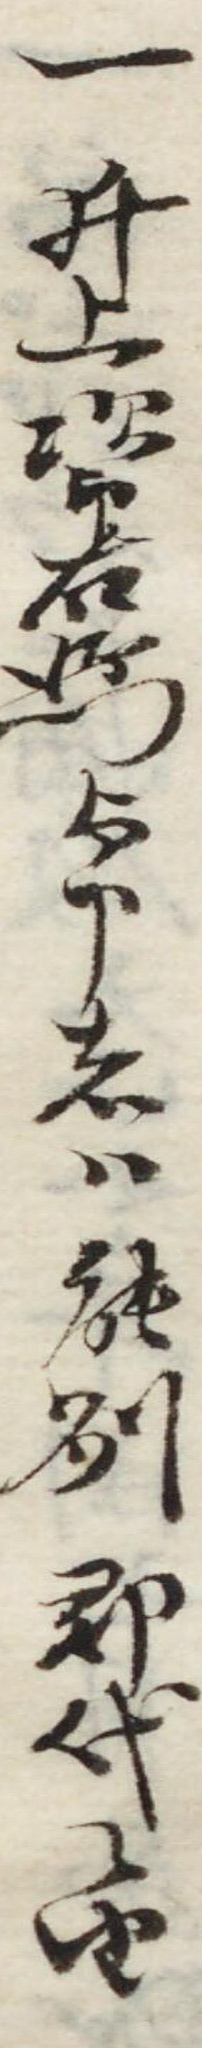一井上次郎右衛門与申者は能州郡代之由
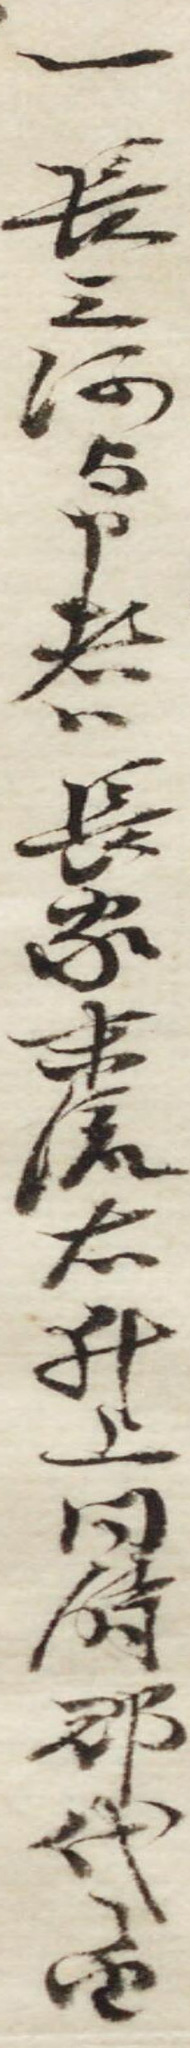一長三河与申者は長家末流右井上同時郡代之由
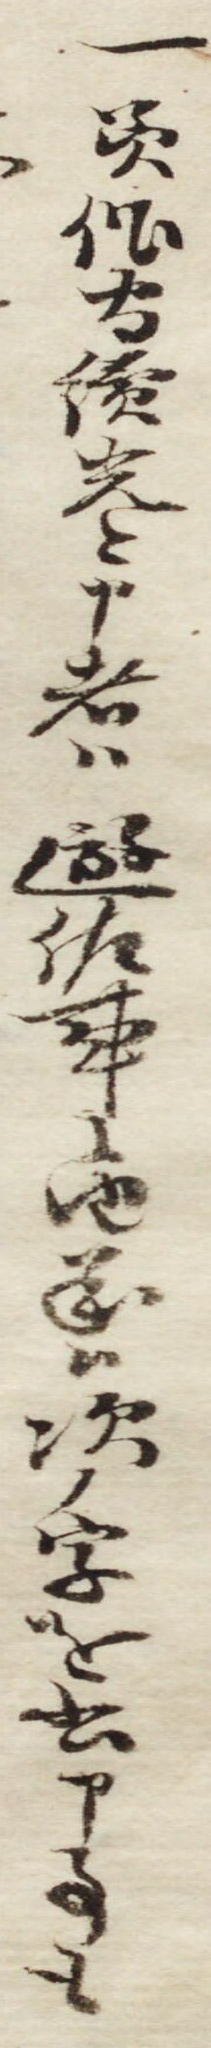一美作守続光と申者は遊佐事之由承候次ノ字を書申事も
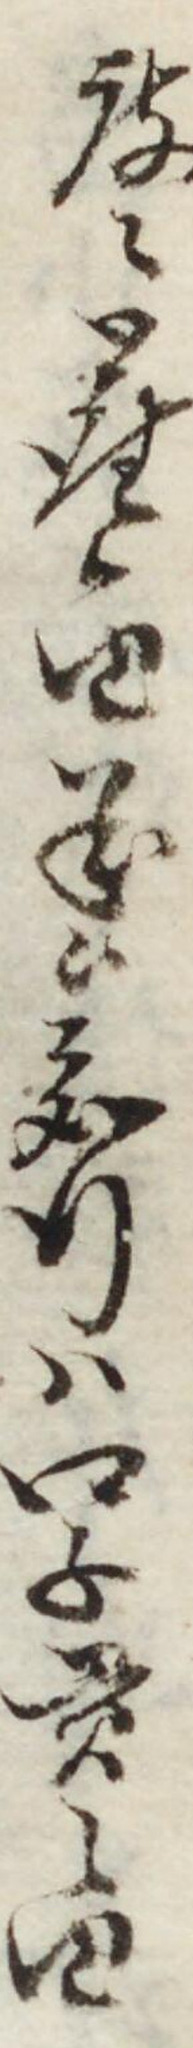度々御座候由承候知行は四千貫之由
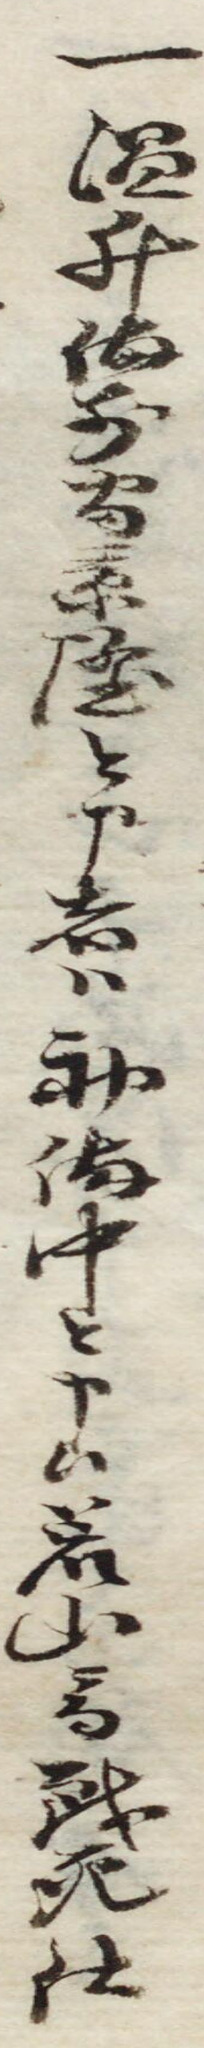一温井備前守景隆と申者は初備中と申候荒山に而戦死仕
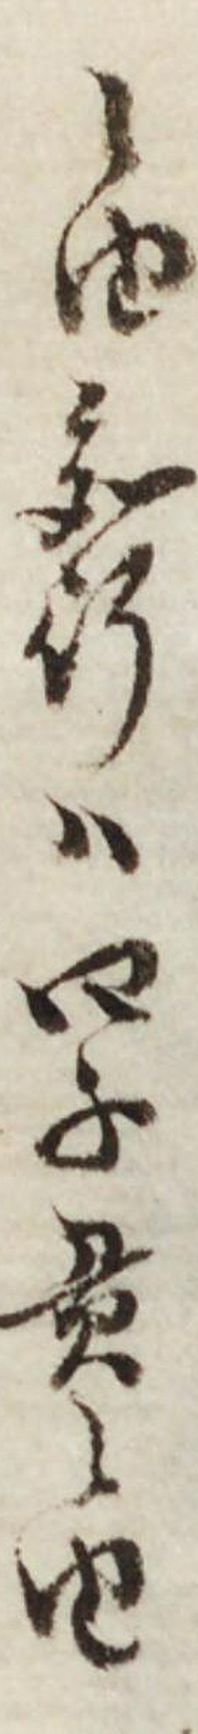之由知行は四千貫之由
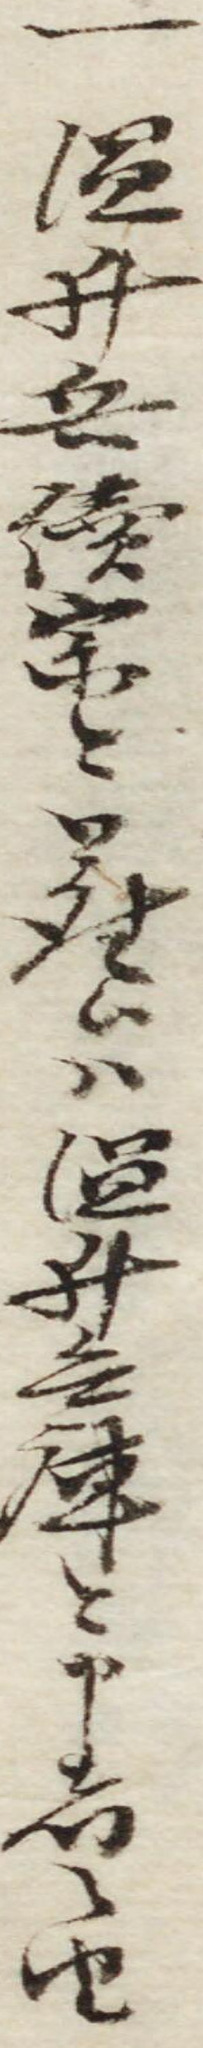一温井兵続宗と御座候は温井兵庫と申者之由
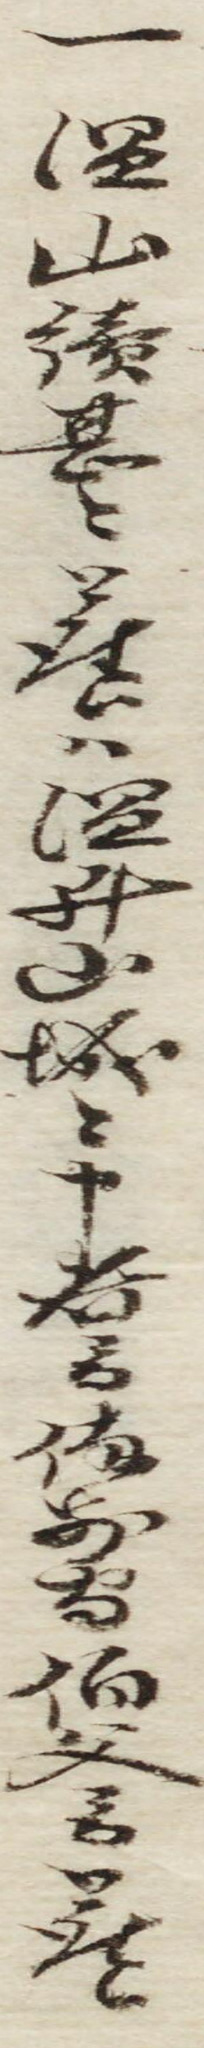一温山続甚と御座候は温井山城と申者に而備前守伯父に而御座候
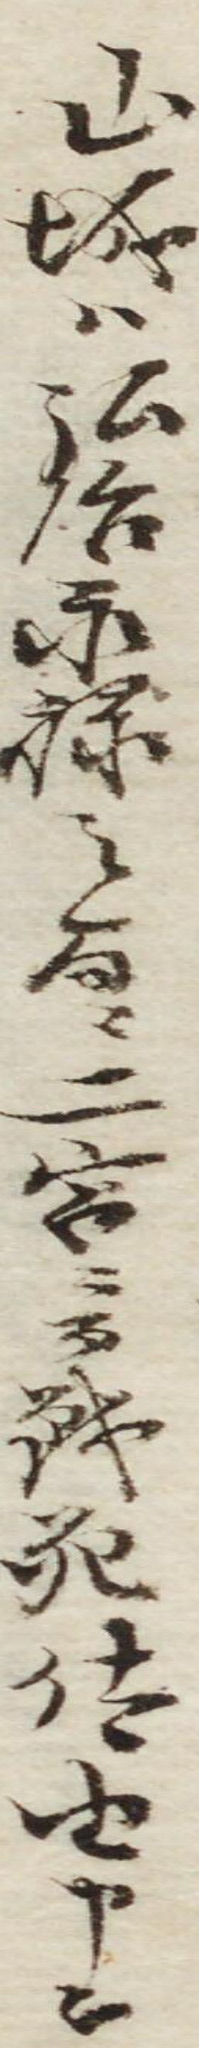山城は弘治永禄之間に二宮に而戦死仕候由申候
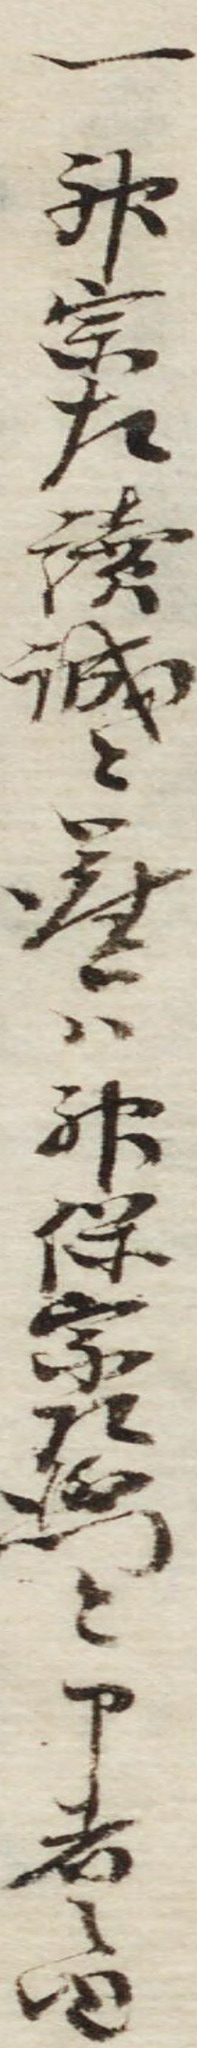一神宗左続城と御座候は神保宗左衛門と申者之由
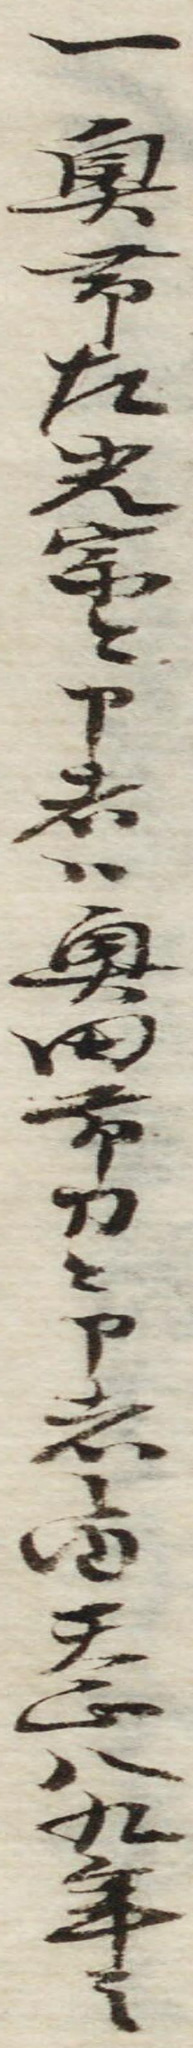一奥帯左光宗と申者は奥田帯刀と申者之由天正八九年之
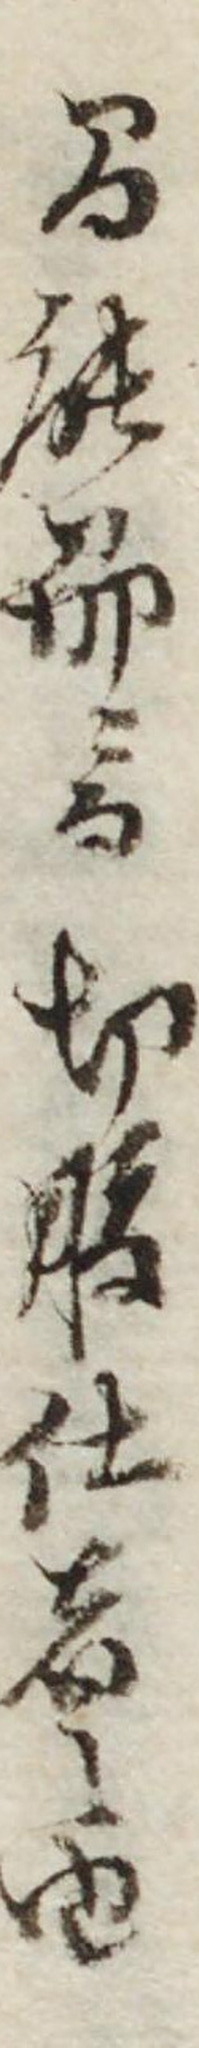間能州に而切腹仕者之由
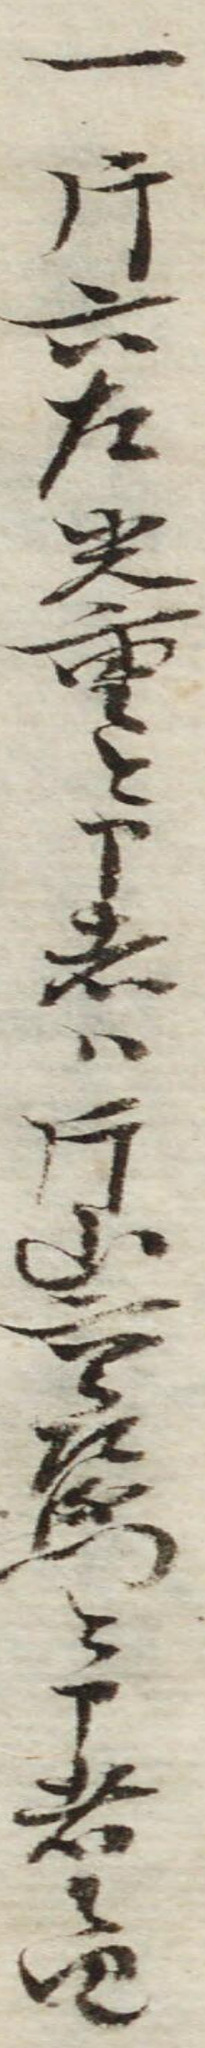一片六左光重と申者は片山重左衛門と申者之由
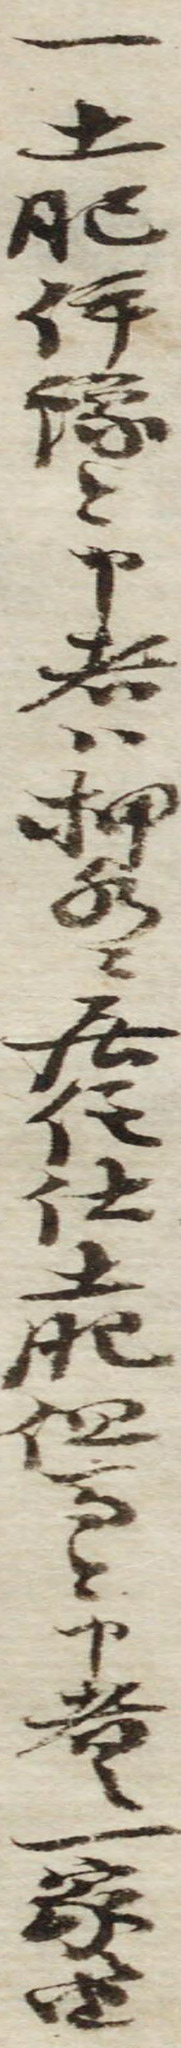一土肥伊予と申者は押水に居住仕土肥但馬と申者之一家之由
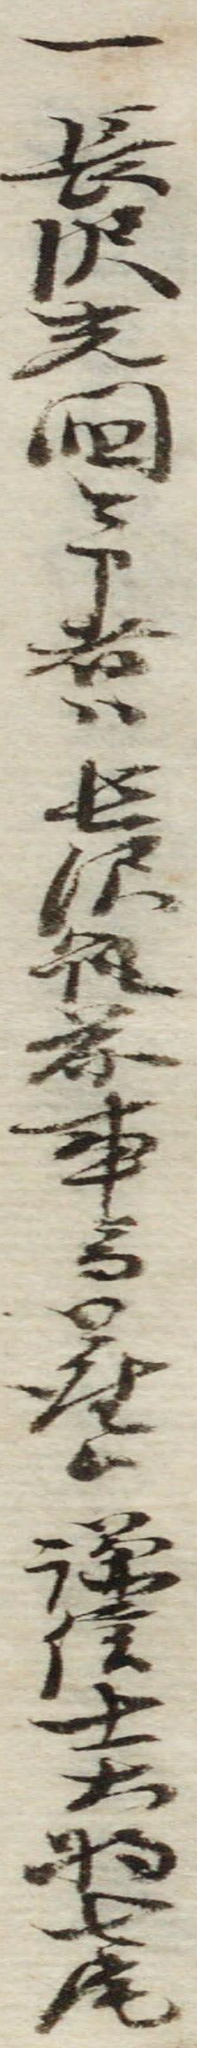一長沢光国と申者は長沢筑前事に而御座候謙信士大将七尾
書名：古老紀談等
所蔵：Ishikawa Prefectural Library
